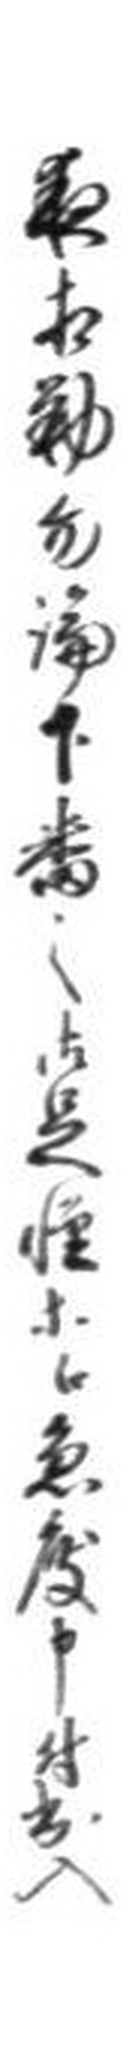夜相勤勿論下番之御足軽等江急度申付出入
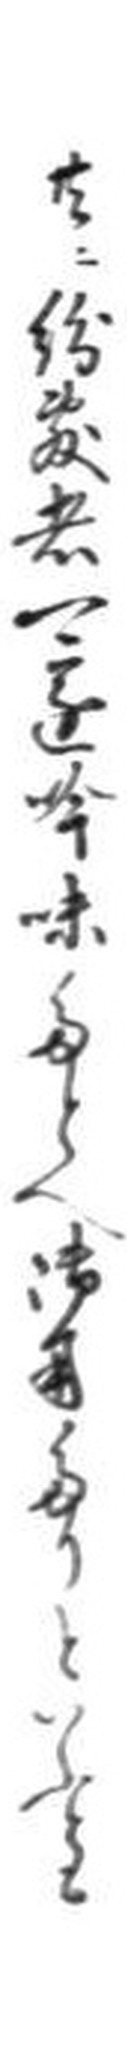共ニ紛敷者可遂吟味たとへ御用たりといふとも
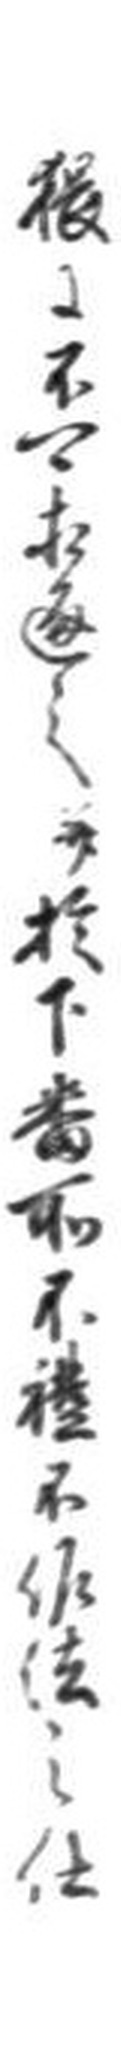猥に不可相通之并於下番所不礼不作法之仕
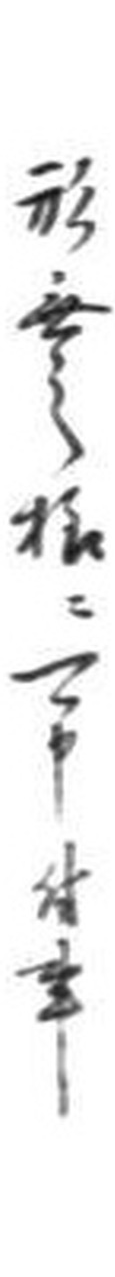形無之様ニ可申付事
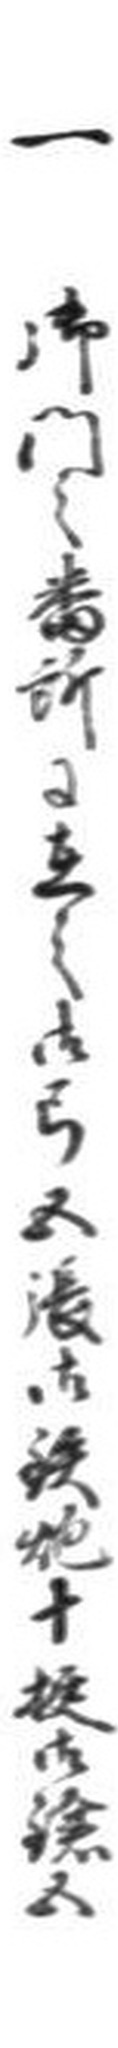一御門之番所に在之御弓五張御鉄炮十挺御鎗五
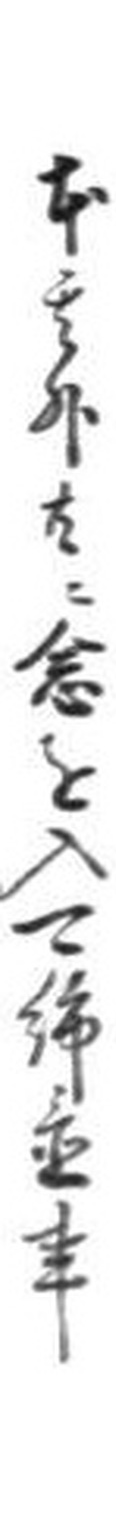本其外共ニ念を入可飾置事
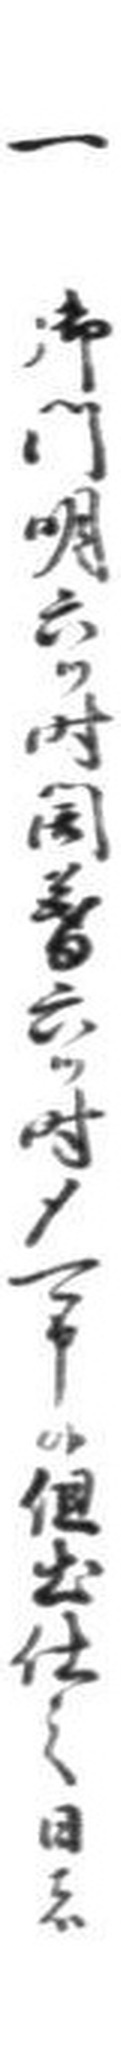一御門明六ツ時開暮六ツ時〆可申候但出仕之日者
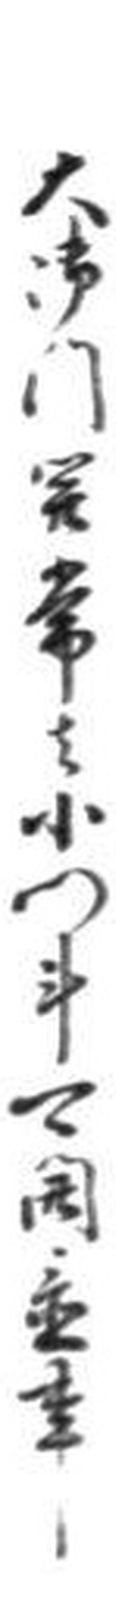大御門開常者小門斗開置事
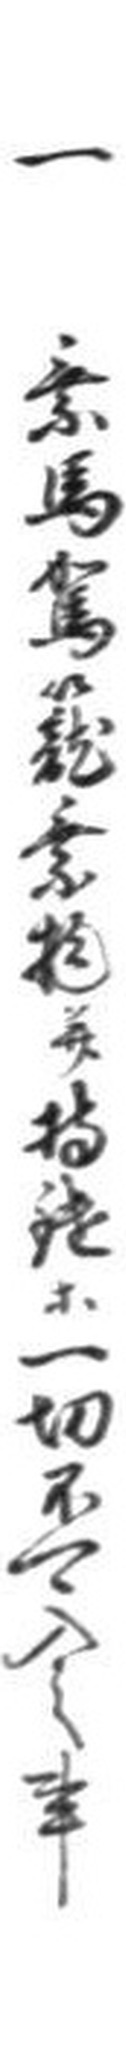一乗馬駕籠乗物并持鑓等一切不可入之事

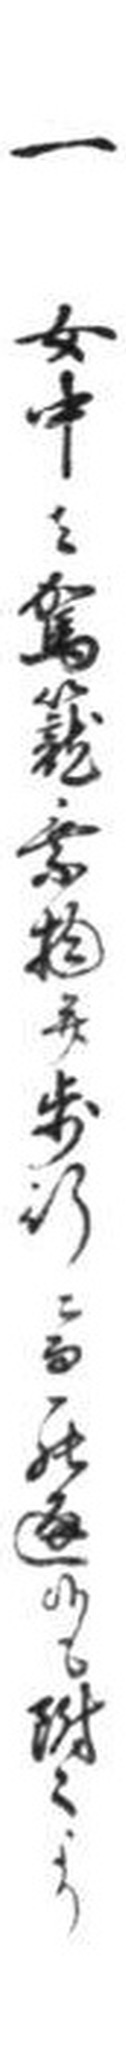一女中者駕籠乗物并歩行ニ而罷通候も付々より
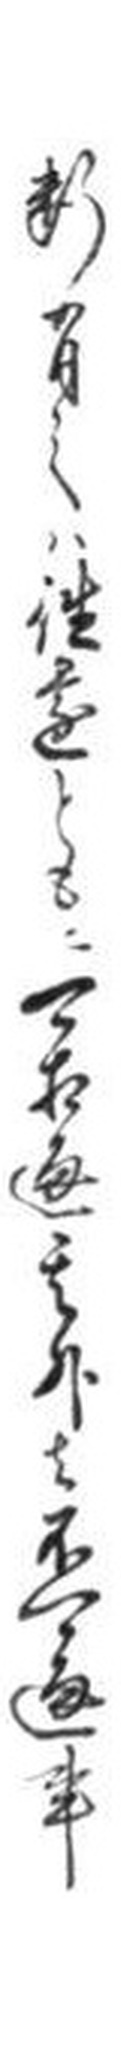断有之ハ往還ともニ可相通其外者不可通事
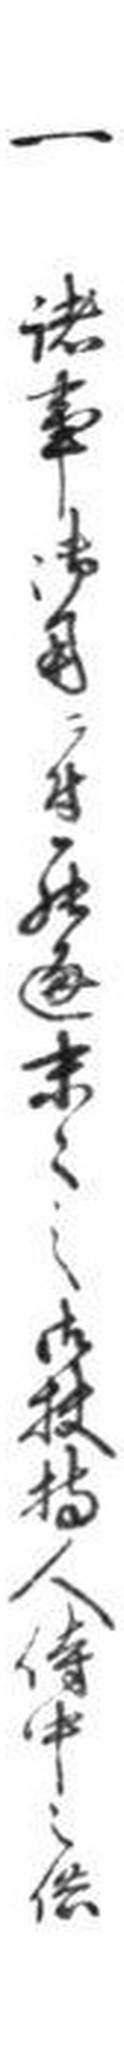一諸事御用ニ付罷通末々之御扶持人侍中之供
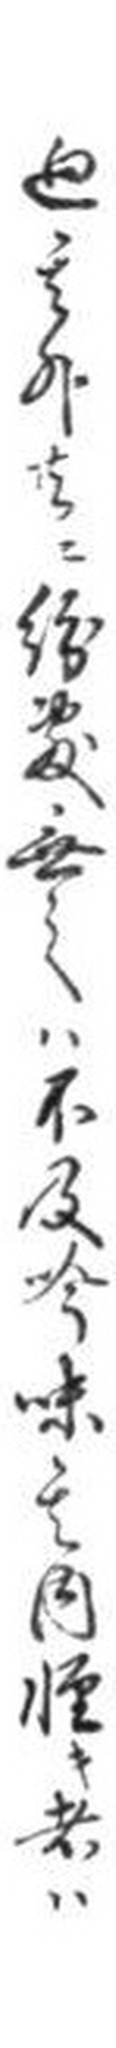廻其外共ニ紛敷無之ハ不及吟味其内軽キ者ハ
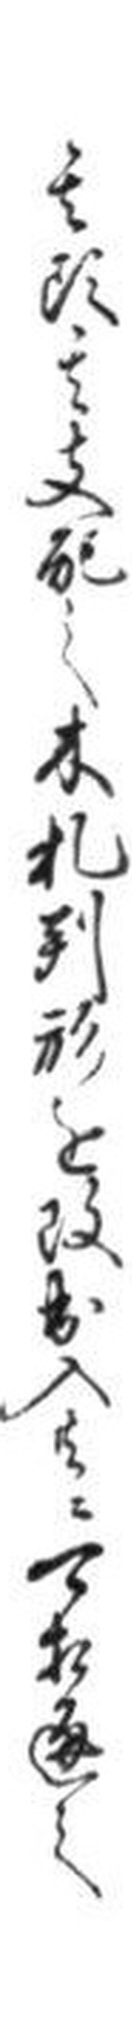其頭其支配之木札判形を改出入共ニ可相通之
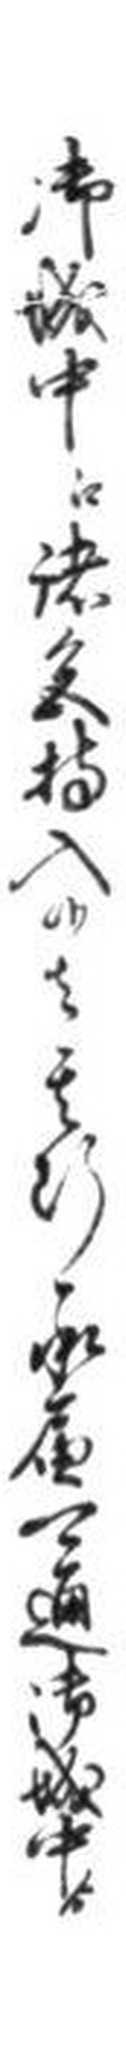御城中江諸色持入候者其断承届可通御城中ゟ
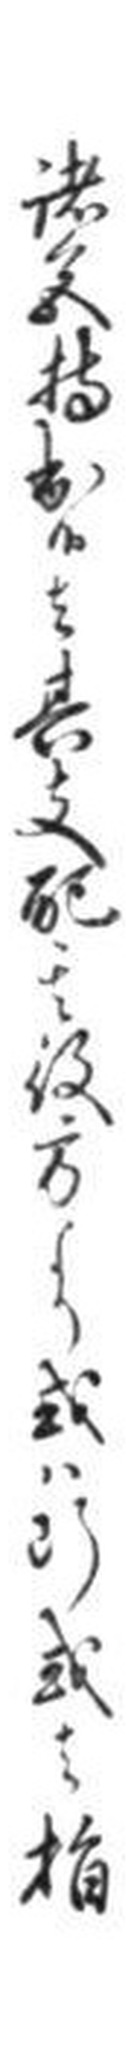諸色持出候者其支配其役方より或ハ断或者指
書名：家譜 三十三 吉邦公 享保四年
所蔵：福井県文書館 Fukui Prefectural Archives
